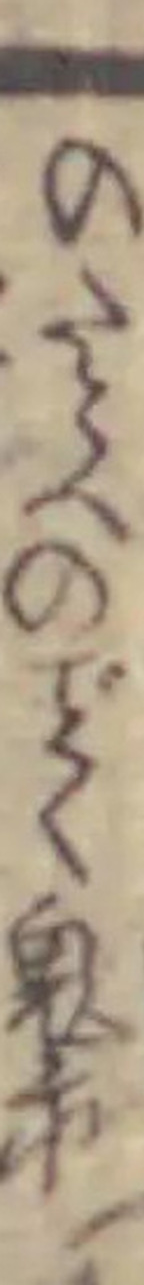のたとへのごとく鬼市
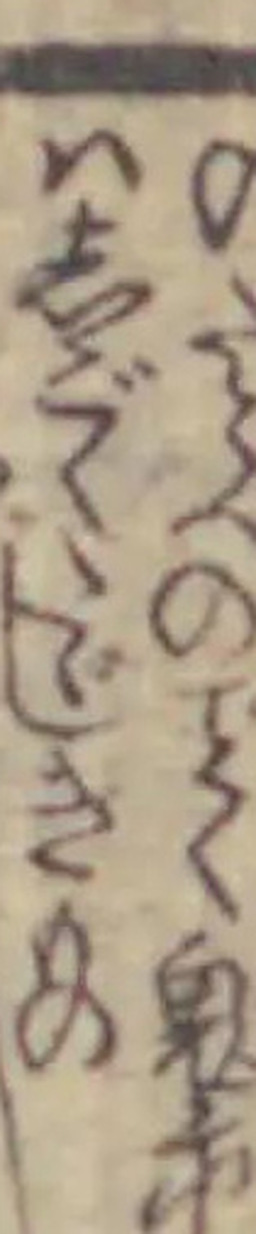はしごくたゞしきもの
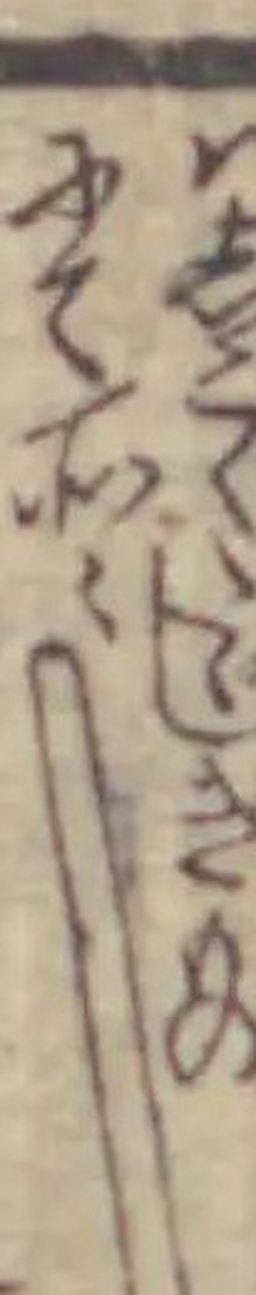にて所々
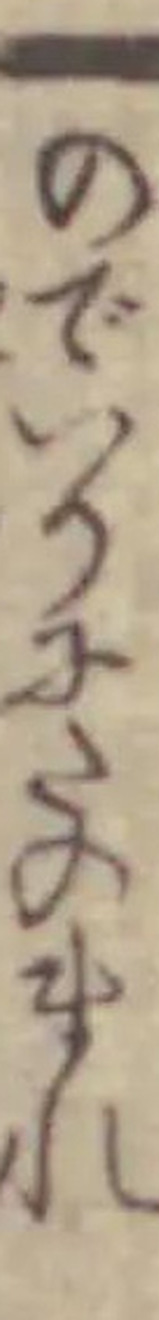のでいりにたのまれ
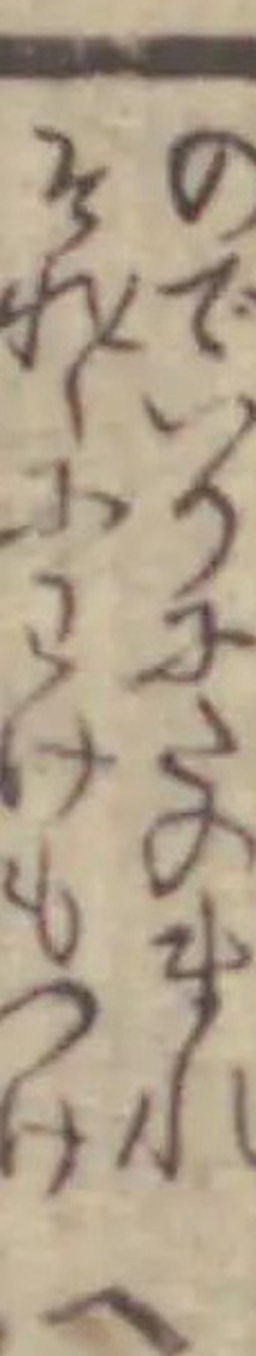それ〳〵にわけもつけ
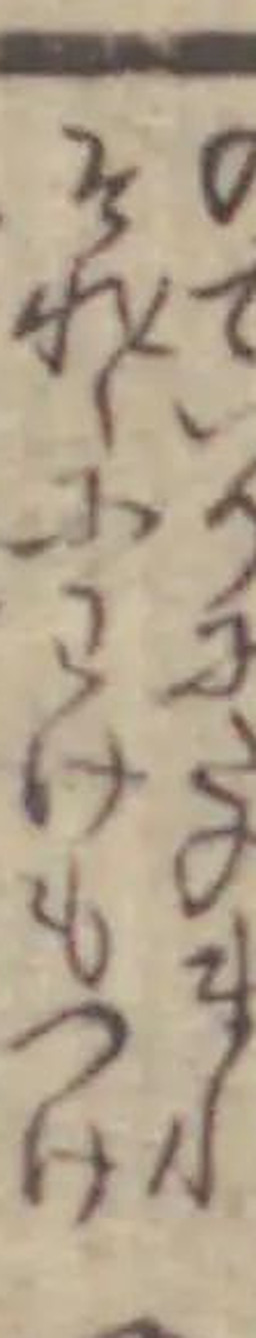それ〳〵にわけもつけ
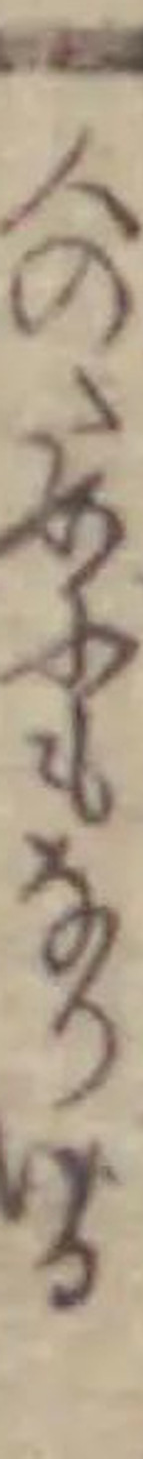人のためにもなりける
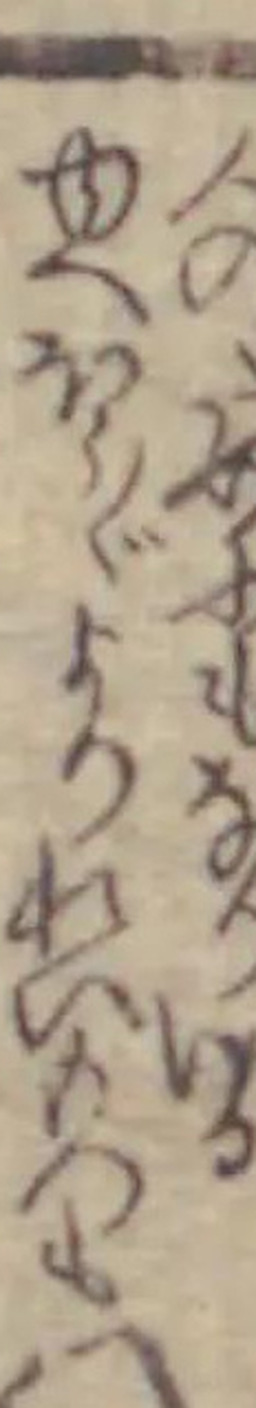ゆへほう〴〵よりれいもつも
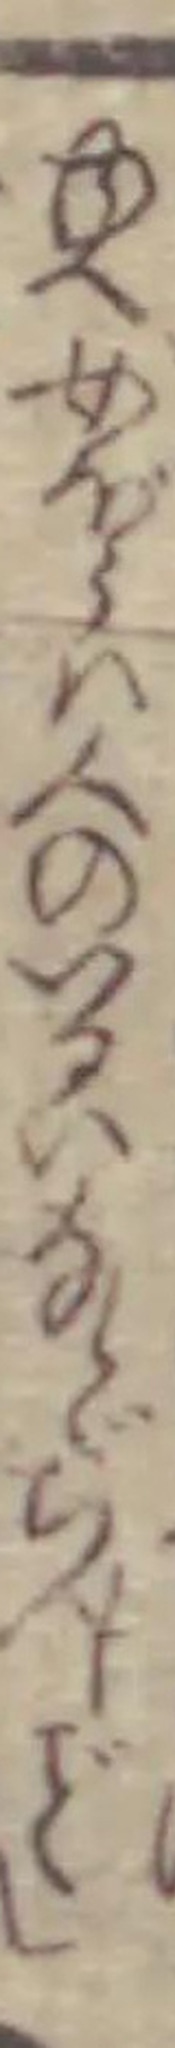ゆへ女ぼうは人のいるいなどちんしごとしし
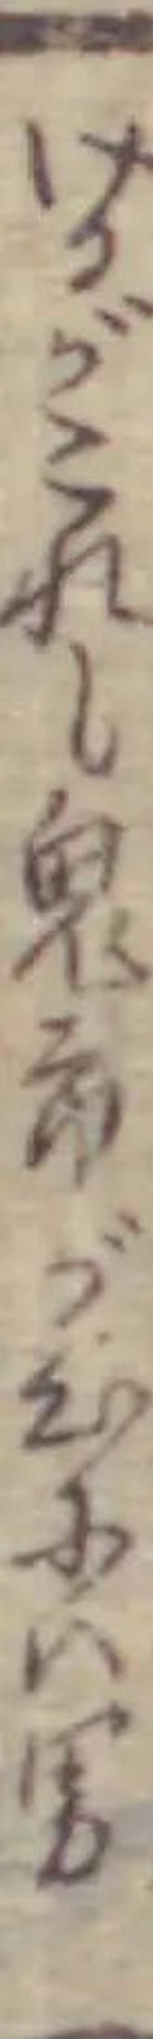けるがこれも鬼市が心には男
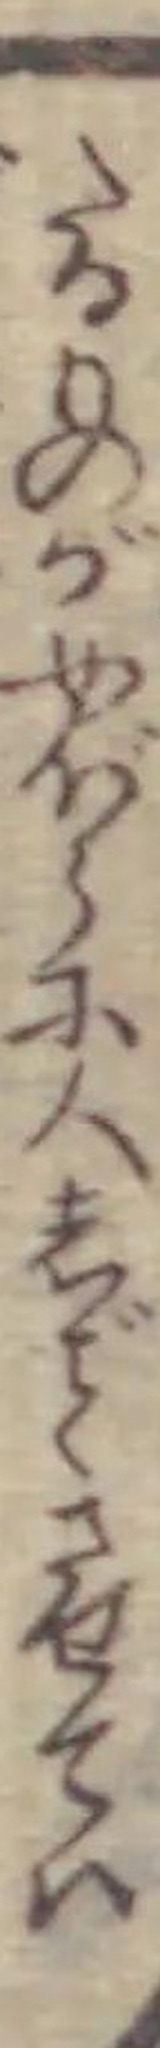たるものが女ぼうに人しごとさせては
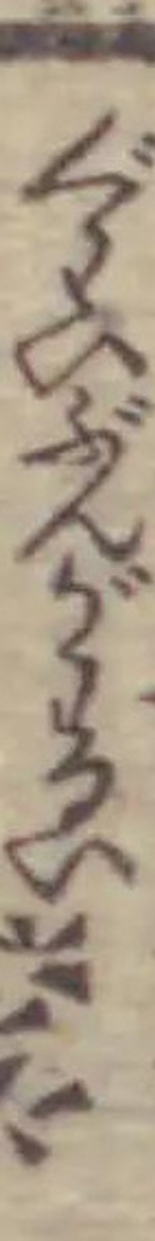ぐわいぶんがわるい
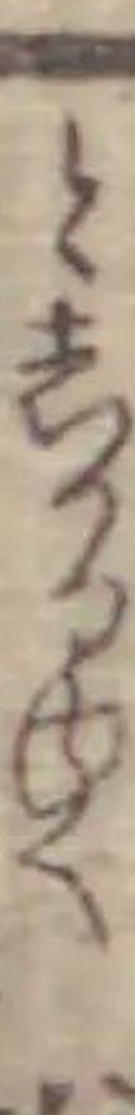としかるゆへ
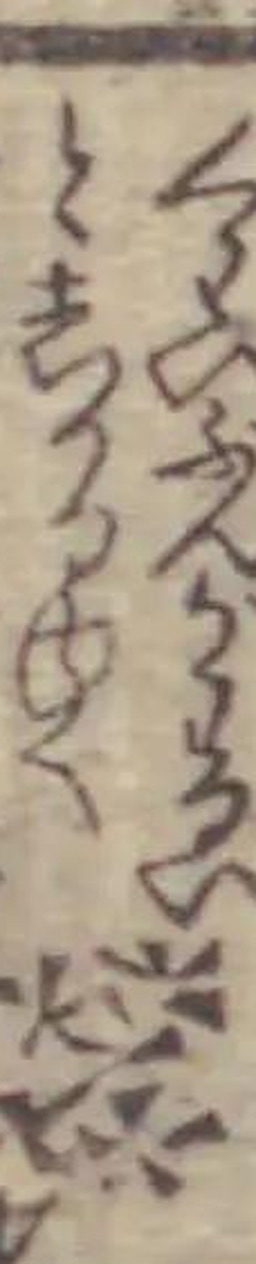としかるゆへ
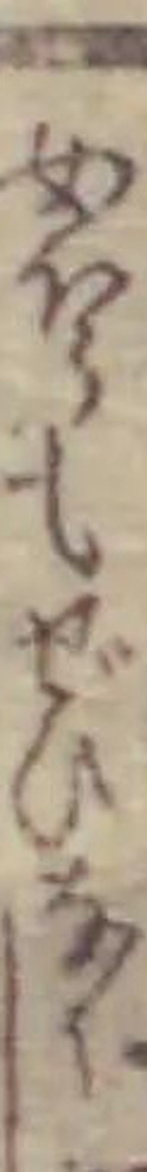女ぼうもぜひなく
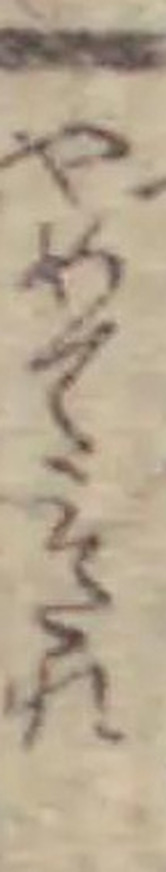やめてみたれ
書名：鬼子宝 3巻
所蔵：国立国会図書館 National Diet Library, JAPAN
